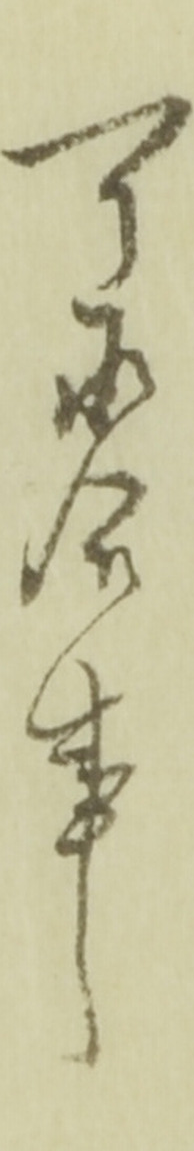可承合事
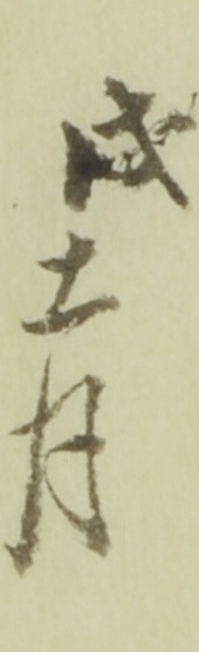戌十一月
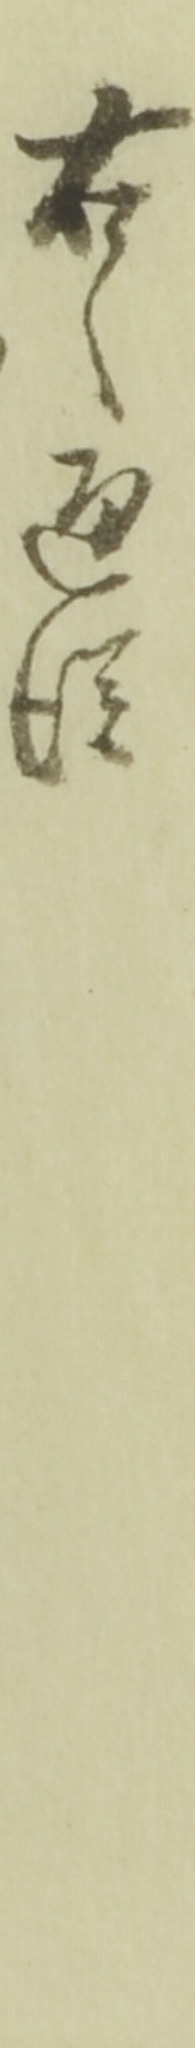右之通従
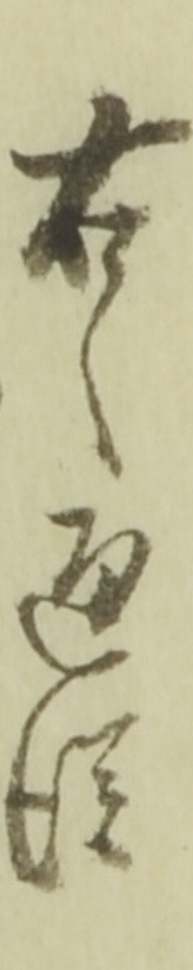右之通従
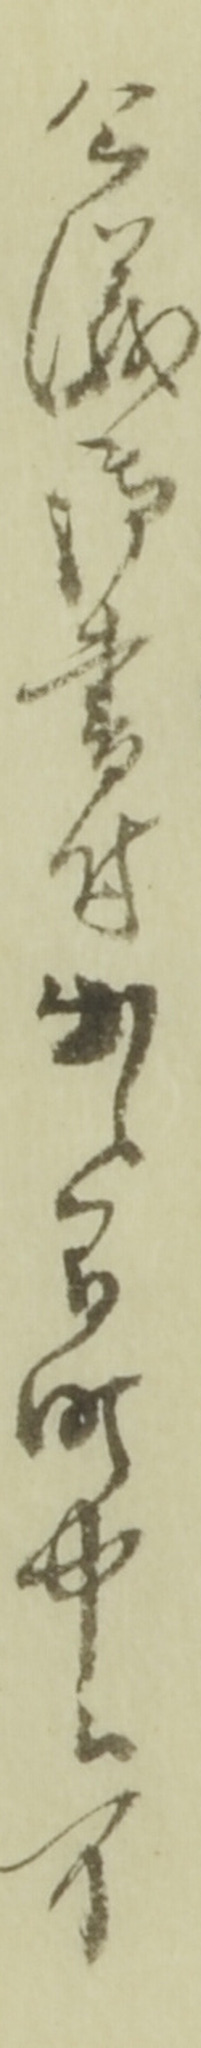公儀御書付出候間町中え可
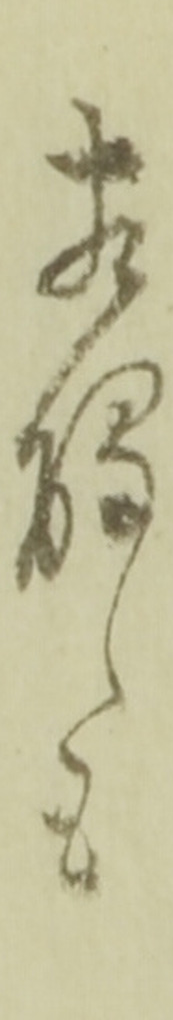相触候以上
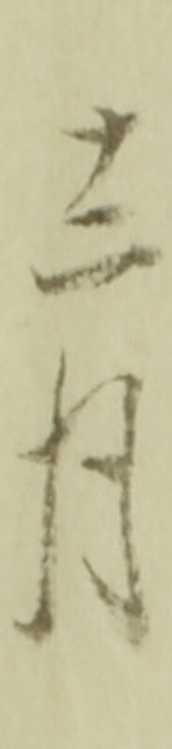十二月
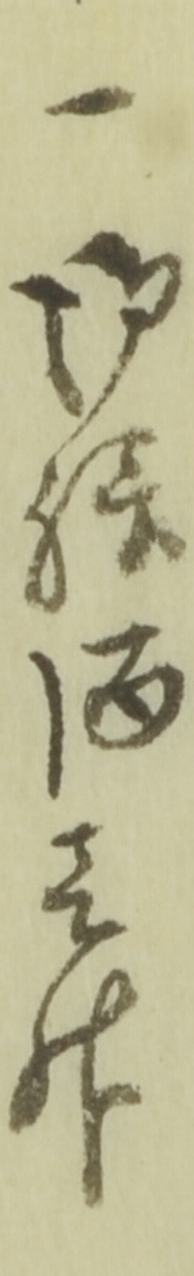一御詰酒壱升
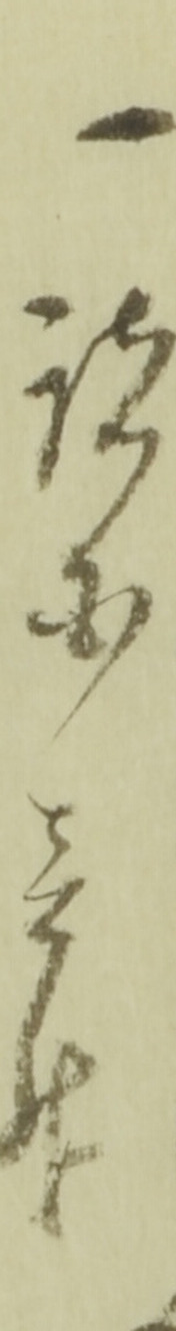一諸国壱升
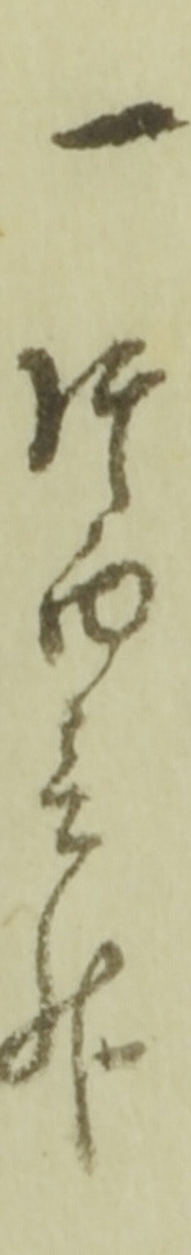一諸国壱升
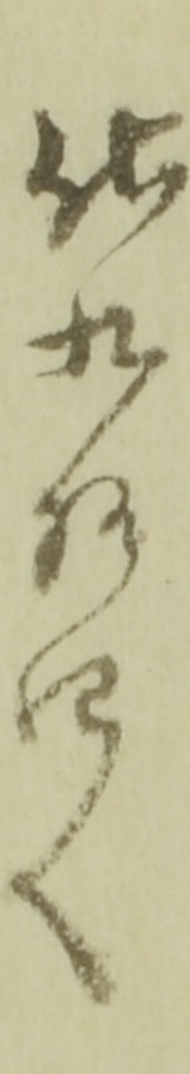代九拾四文
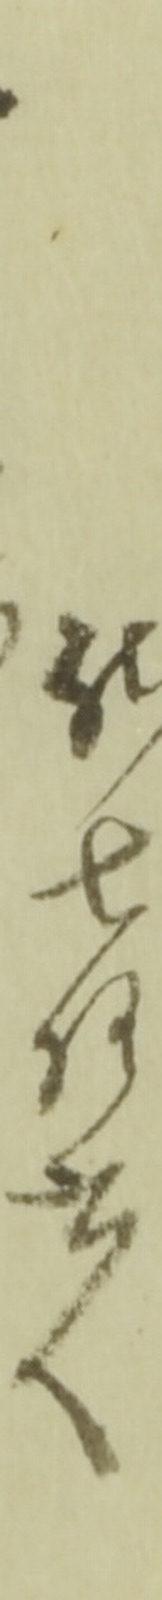代七拾六文
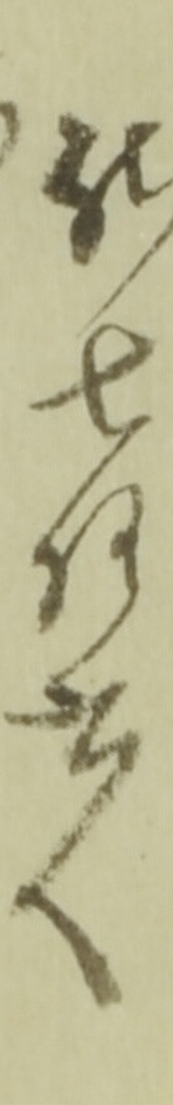代七拾六文
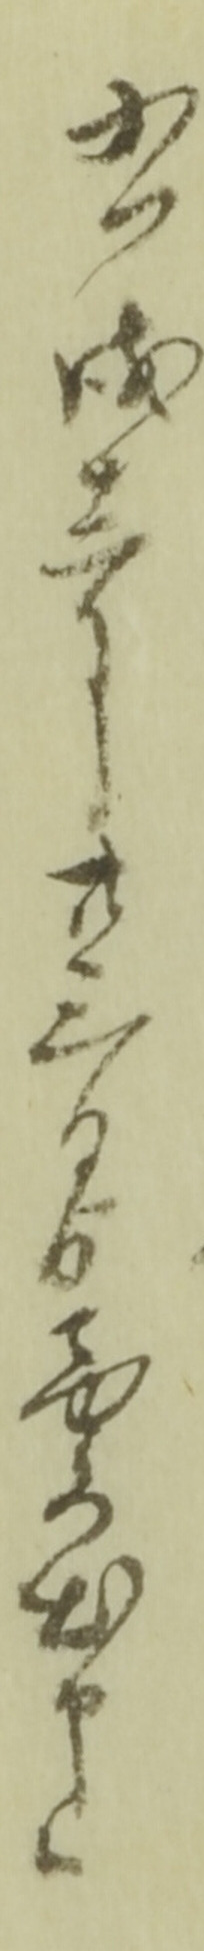右戌十二月廿三日より売出申候以上
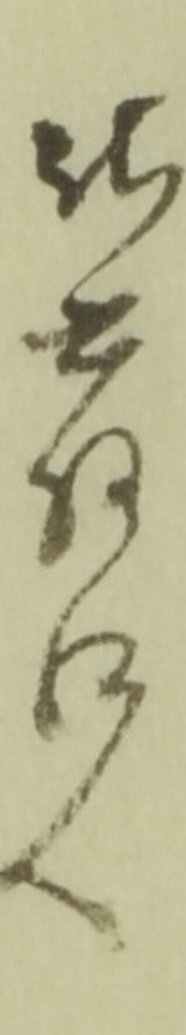代六拾四文
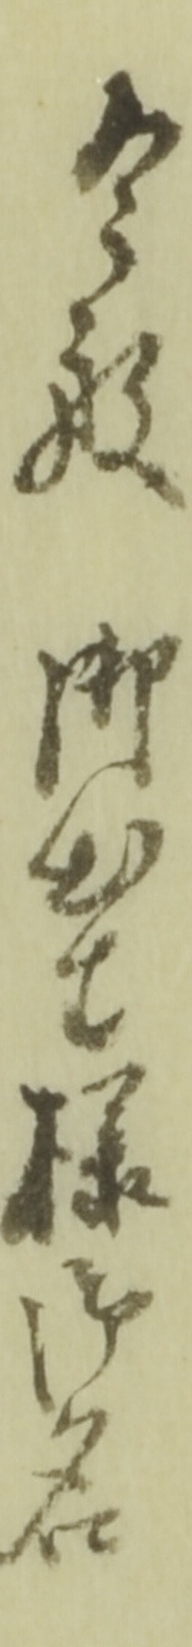今般御出生様御名
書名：御公儀様御領主様御触書控
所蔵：伊那市立高遠町図書館・合同会社AMANE
